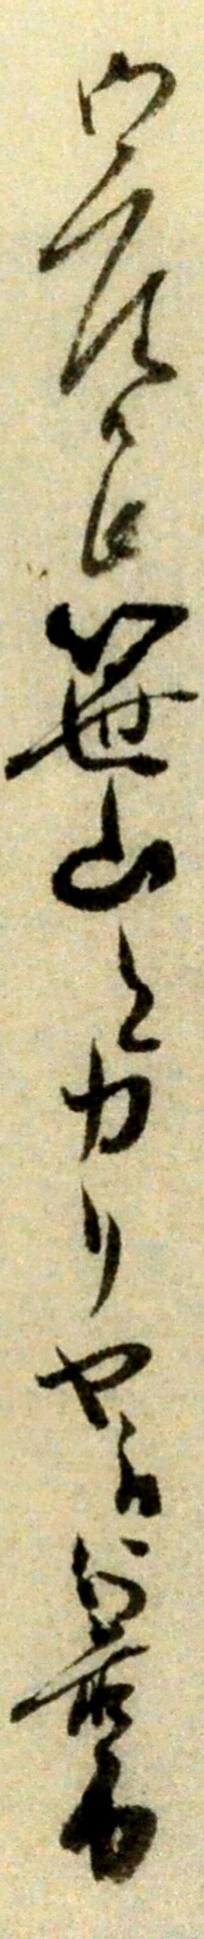御座候由笹山とカリヤえ御普
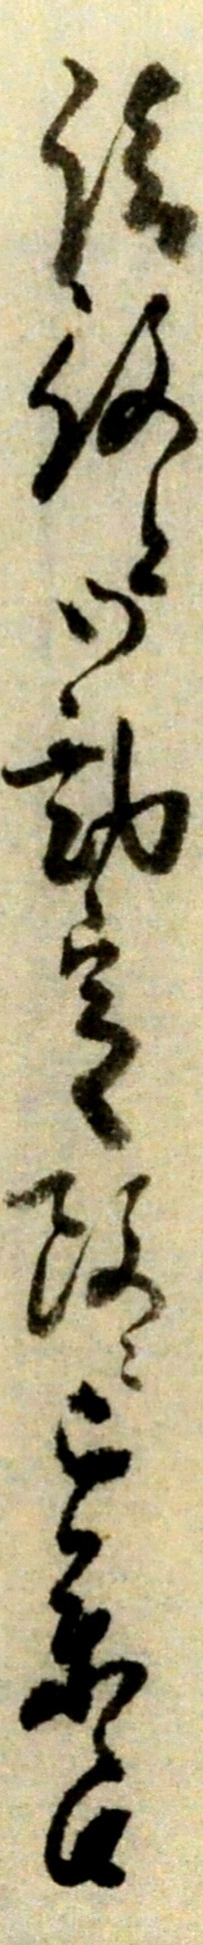請役と御勘定改に被参候由
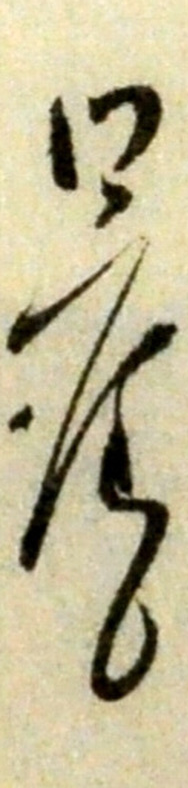御座候
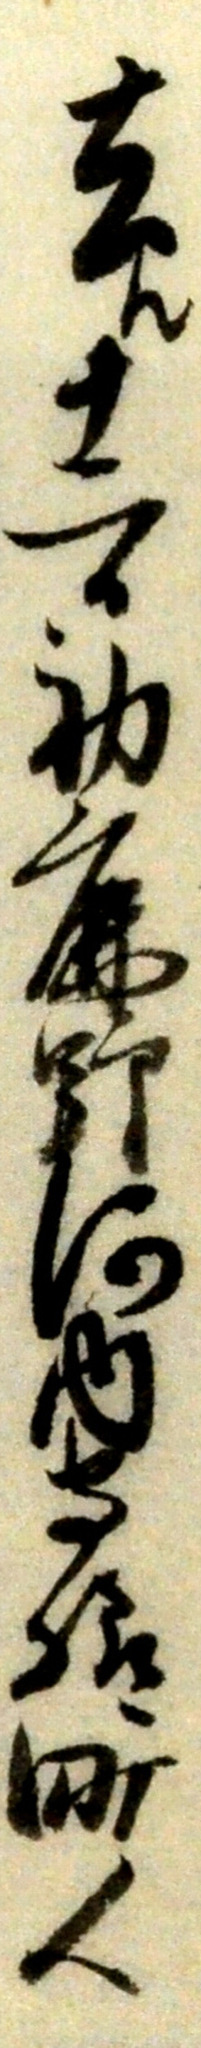去ル十二日初鹿野河内守様へ町人
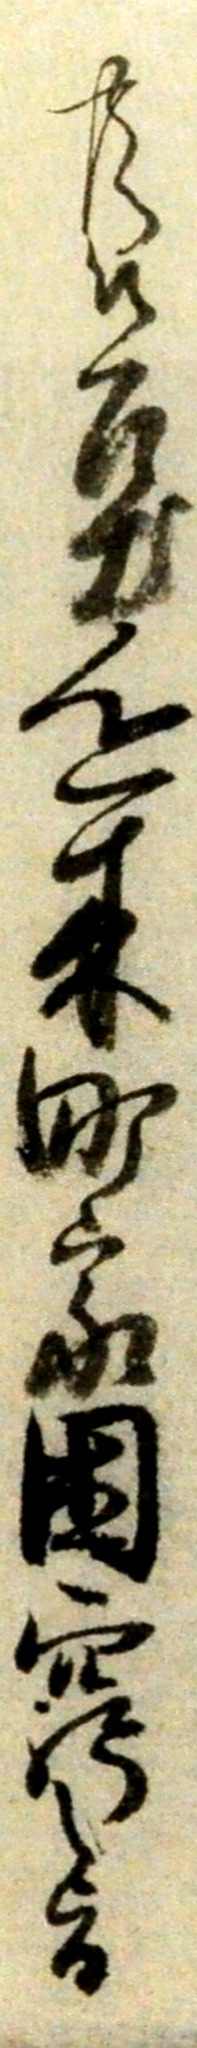共被召出近来町家困窮之旨

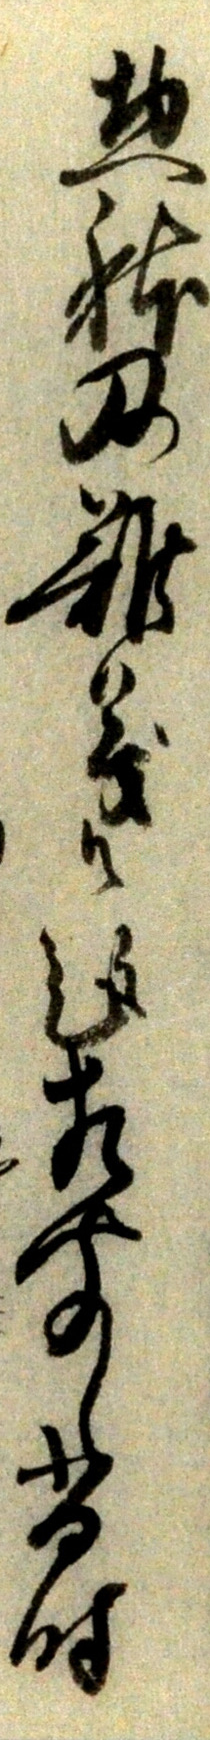惣体及難義候趣相聞候当時
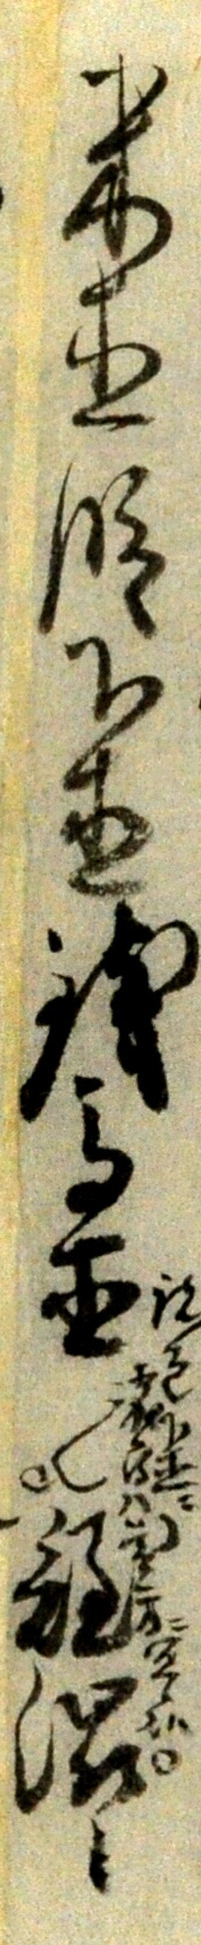米直段下直銭高直〇難渋の
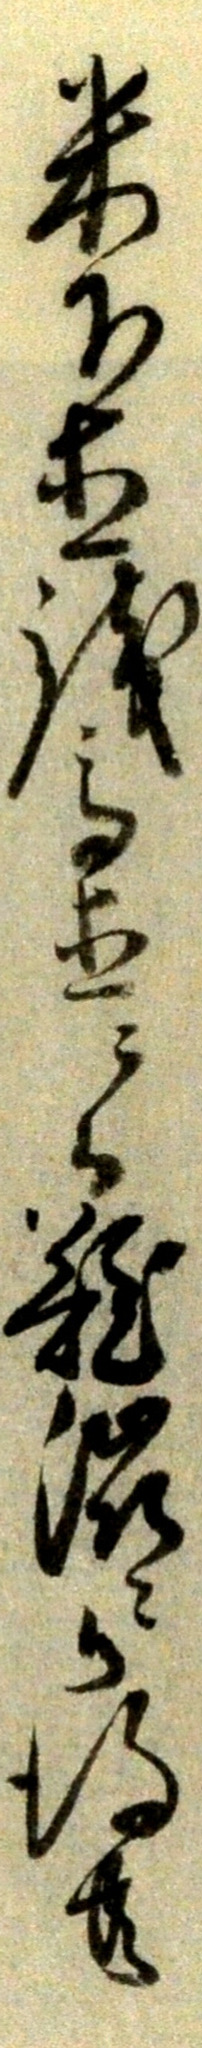米下直銭高直にて難渋に候得共
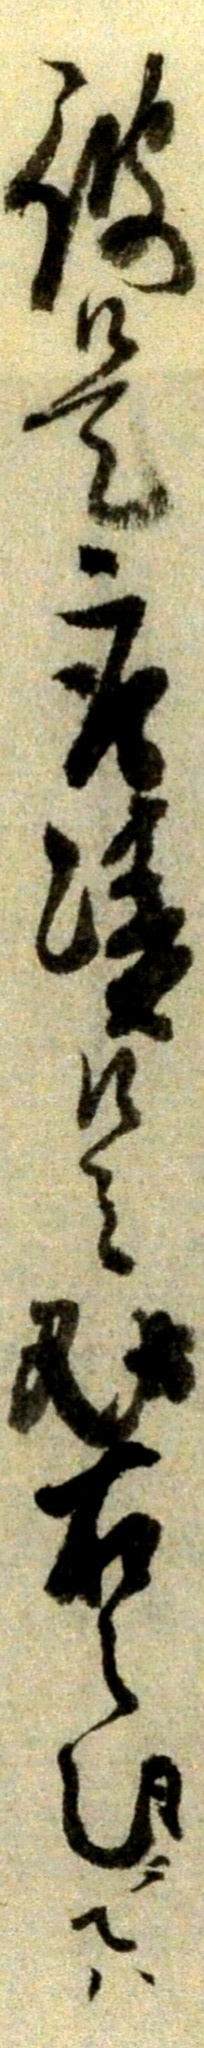彼是取凌候之処右の趣にては
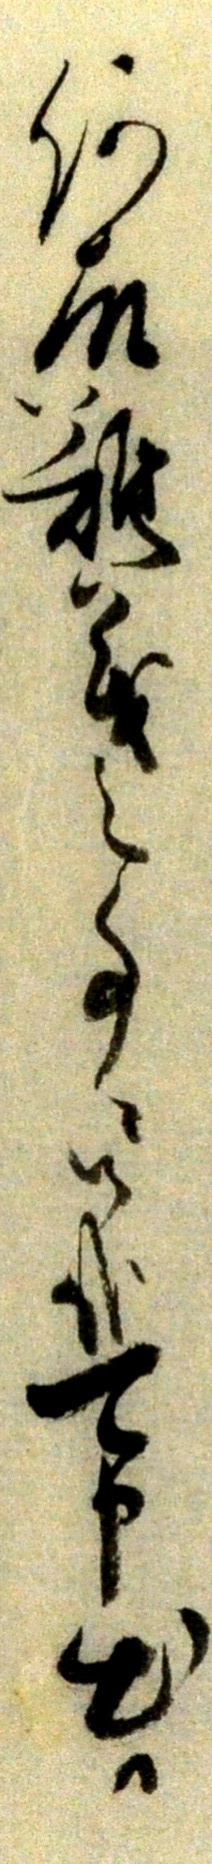何故難義之事に候哉可申出候
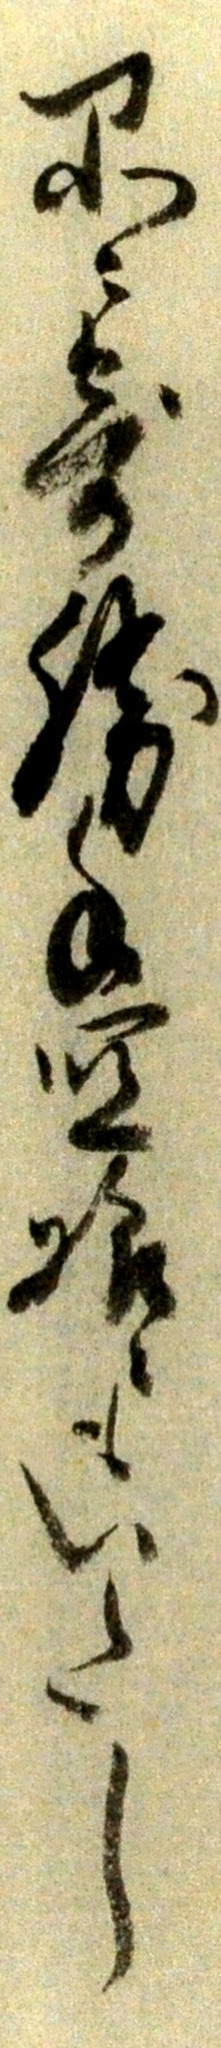品に寄勝手宜様にもいたし
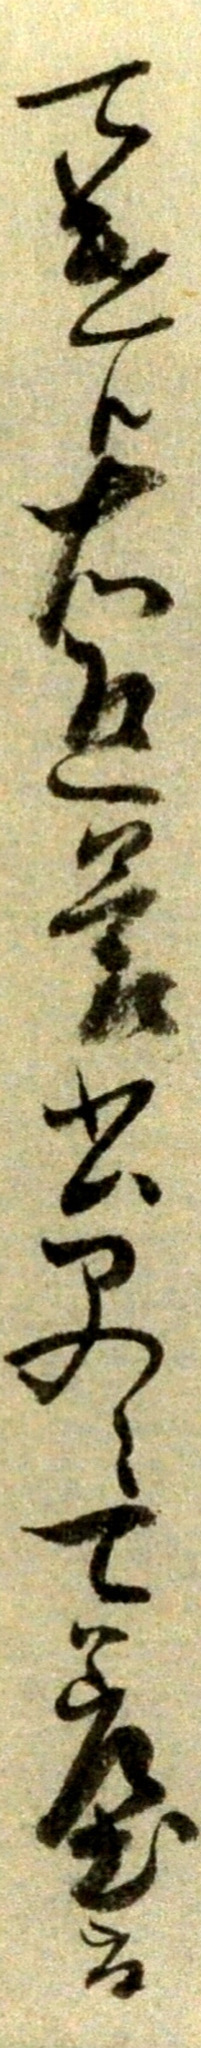可遣候右返答書早々可差出旨
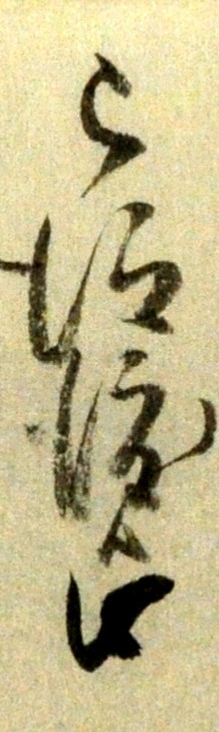被仰渡候由
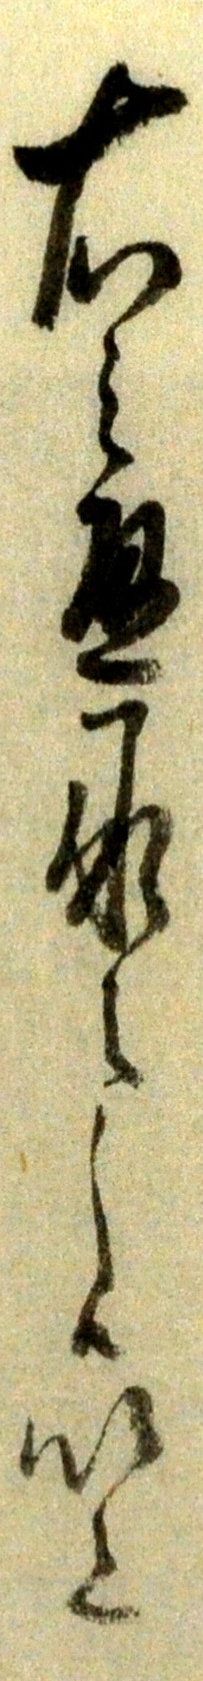右之通承之候以上
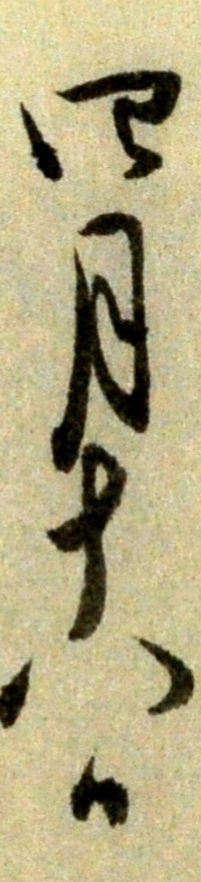四月十八日
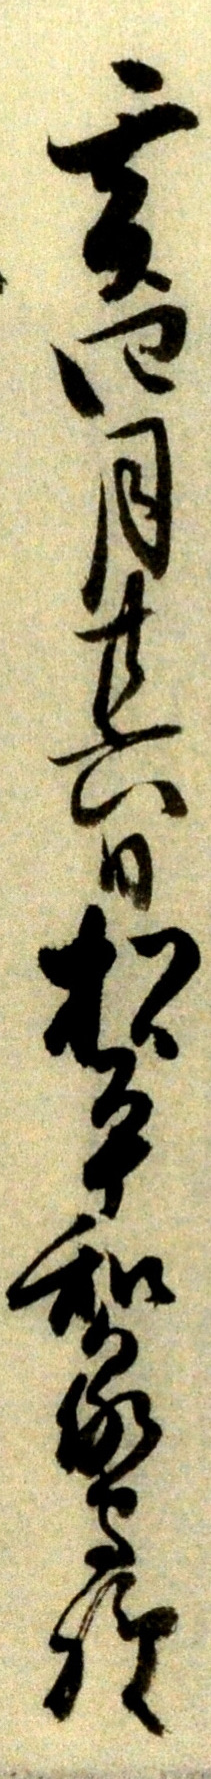亥四月廿六日松平和泉守様
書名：申合帳〔一括〕
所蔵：伊那市立高遠町図書館・合同会社AMANE
